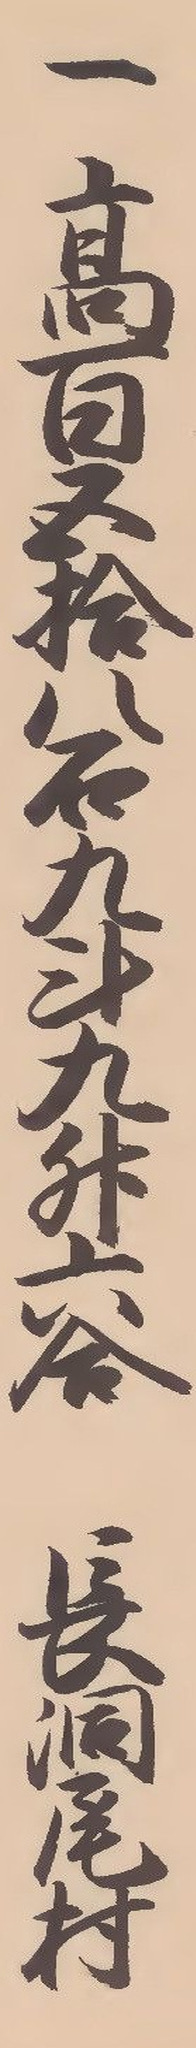一高百五拾八石九斗九升六合長洞尾村
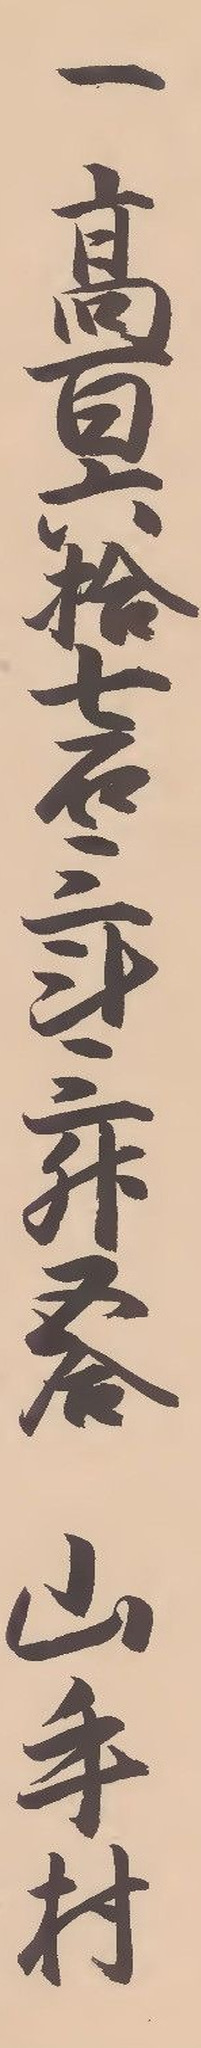一高百六拾七石三斗三升五合山手村
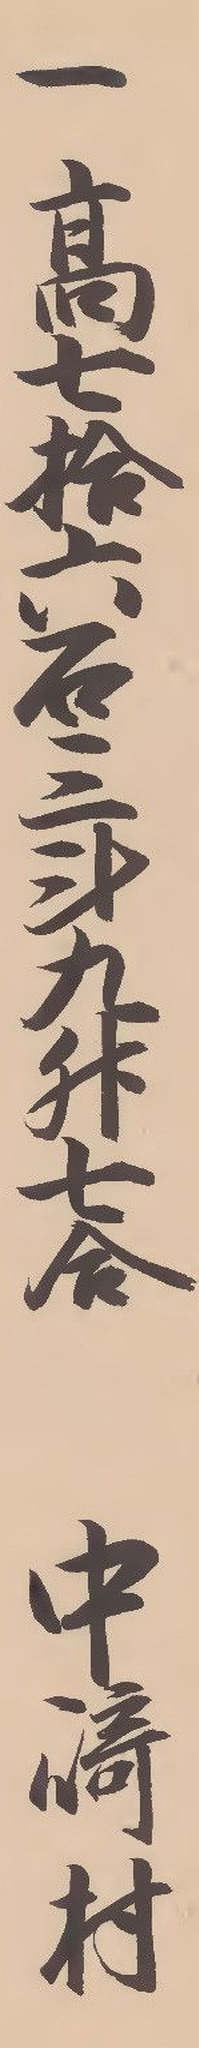一高七拾六石三斗九升七合中崎村
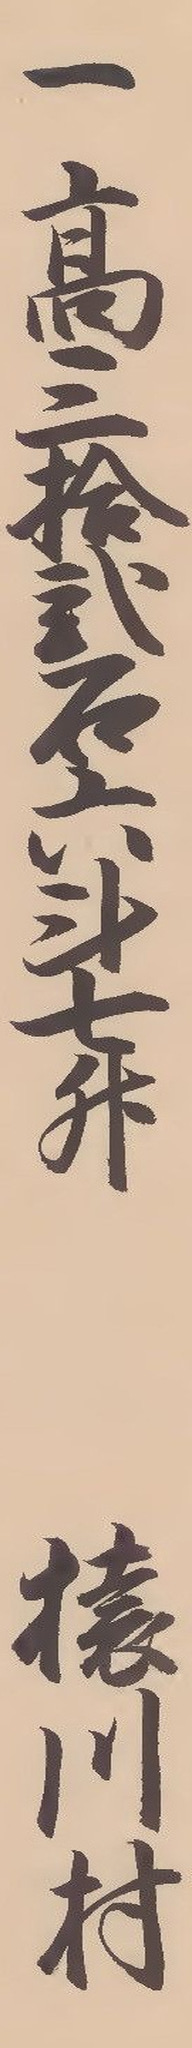一高三拾弐石六斗七升猿川村
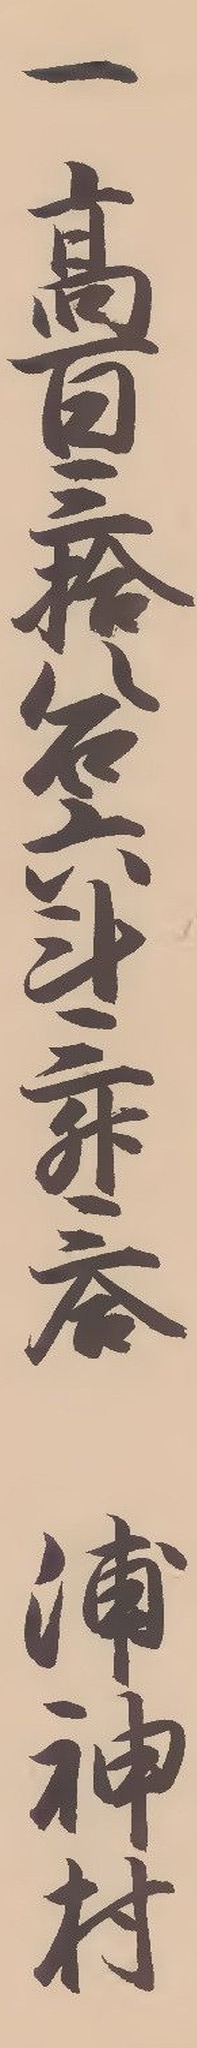一高百三拾八石六斗三升三合浦神村
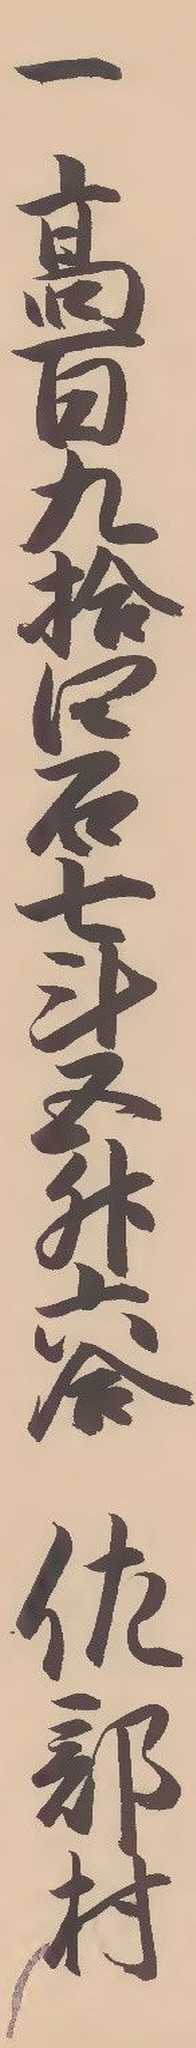一高百九拾四石七斗五升六合佐部村

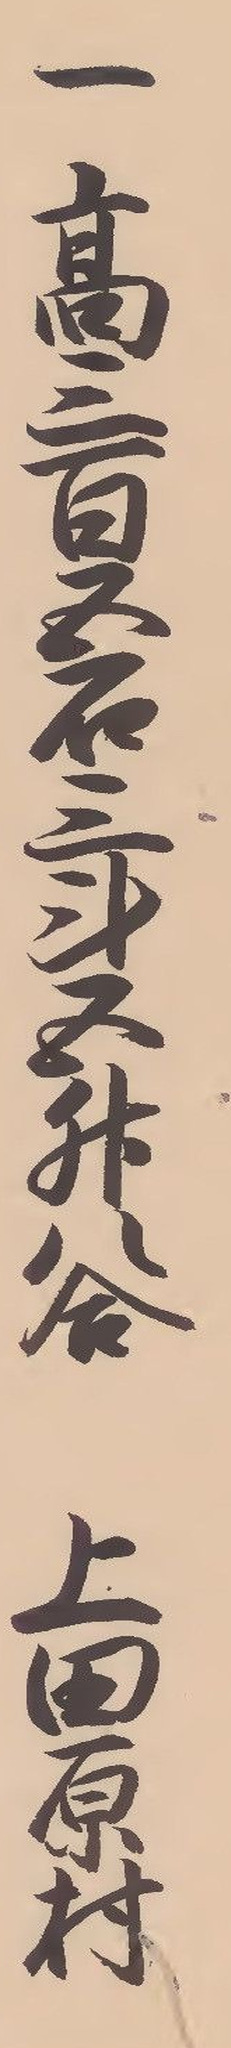一高三百五石三斗五升八合上田原村
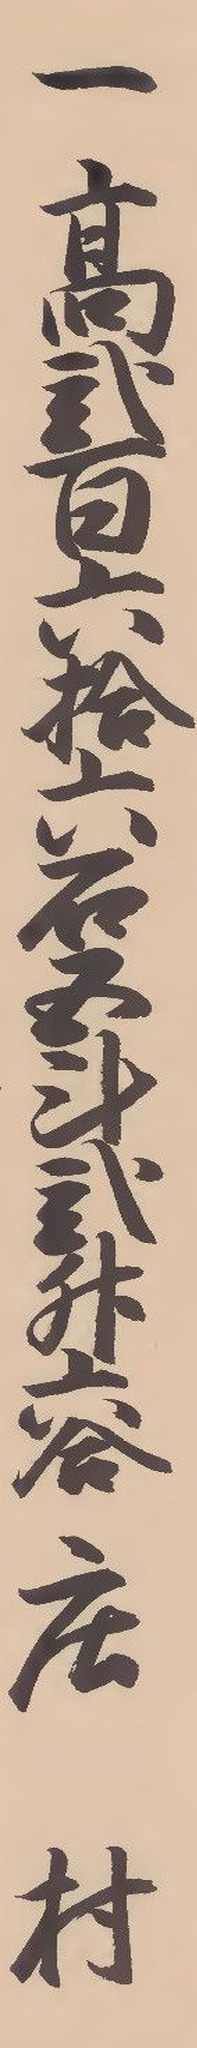一高弐百六拾六石五斗弐升六合庄村
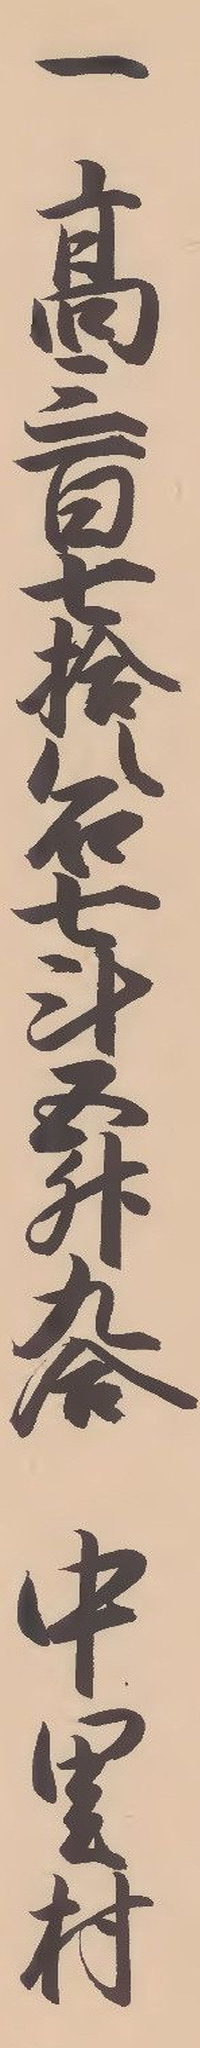一高三百七拾八石七斗五升九合中里村
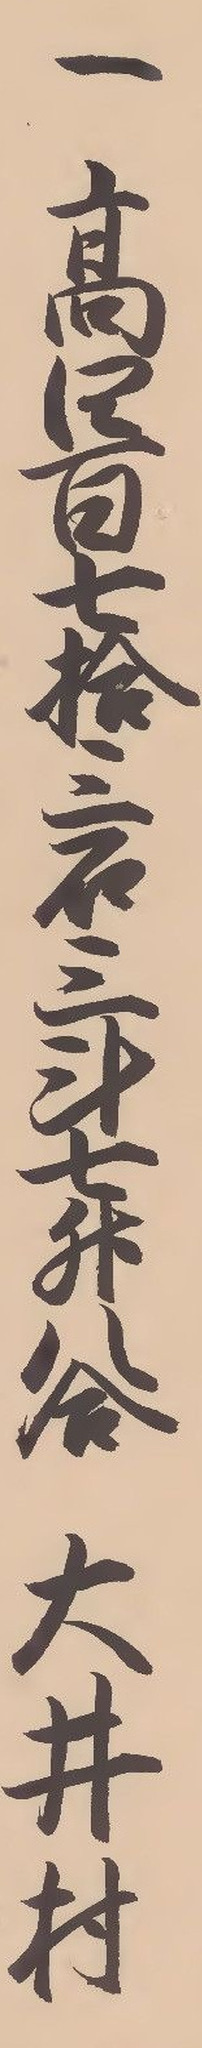一高四百七拾三石三斗七升八合大井村
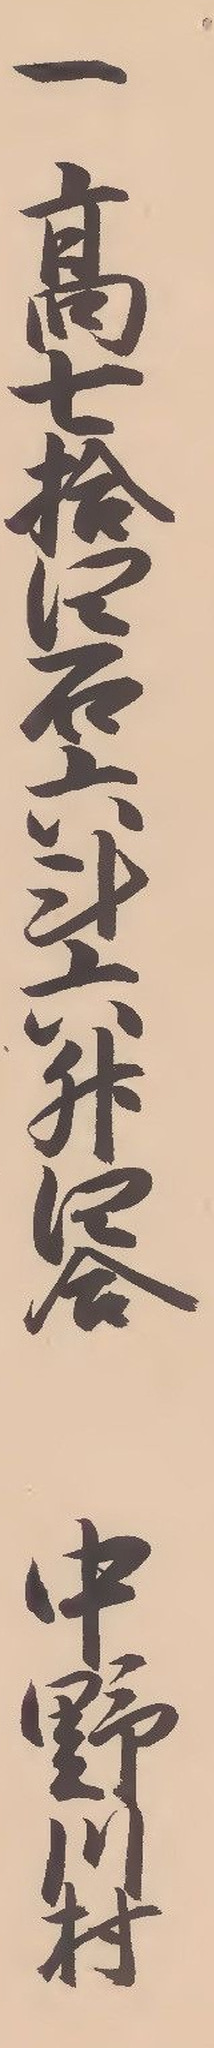一高七拾四石六斗六升四合中野川村
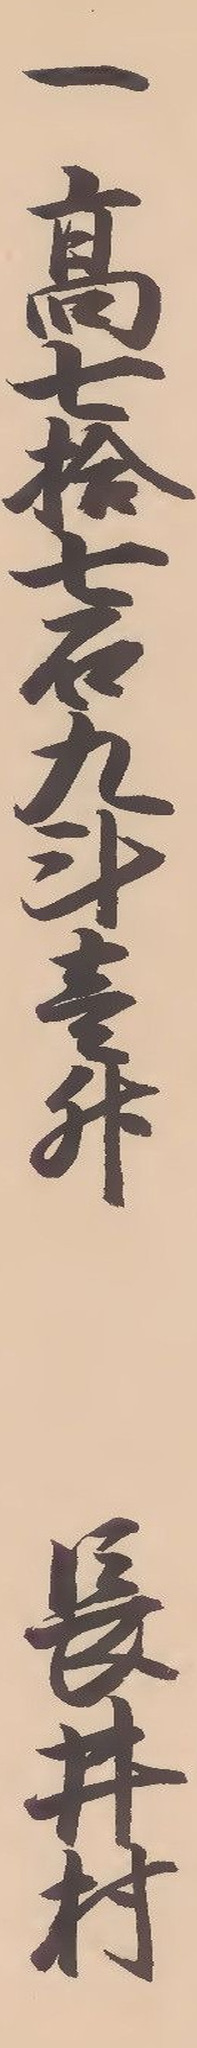一高七拾七石九斗壱升長井村
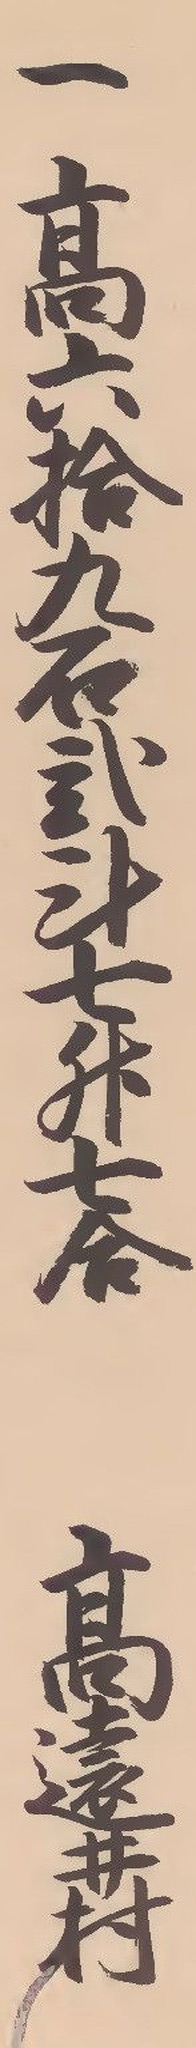一高六拾九石弐斗七升七合高遠井村

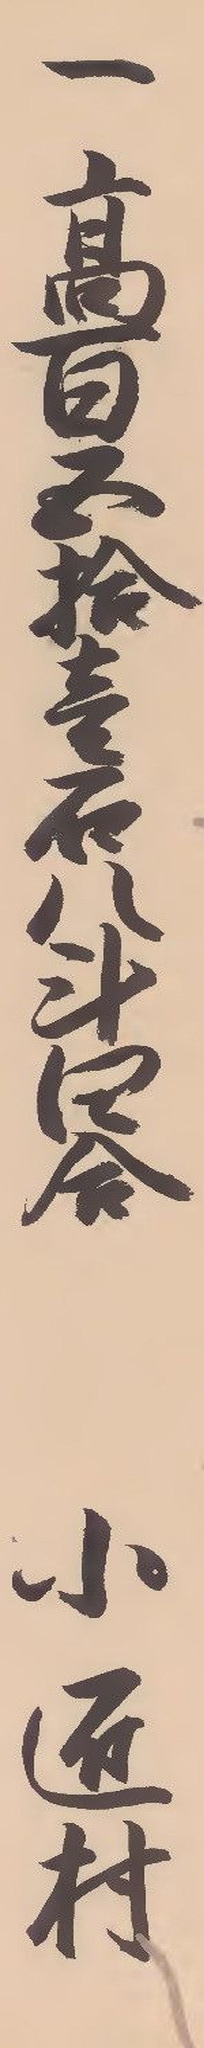一高百五拾壱石八斗四合小匠村
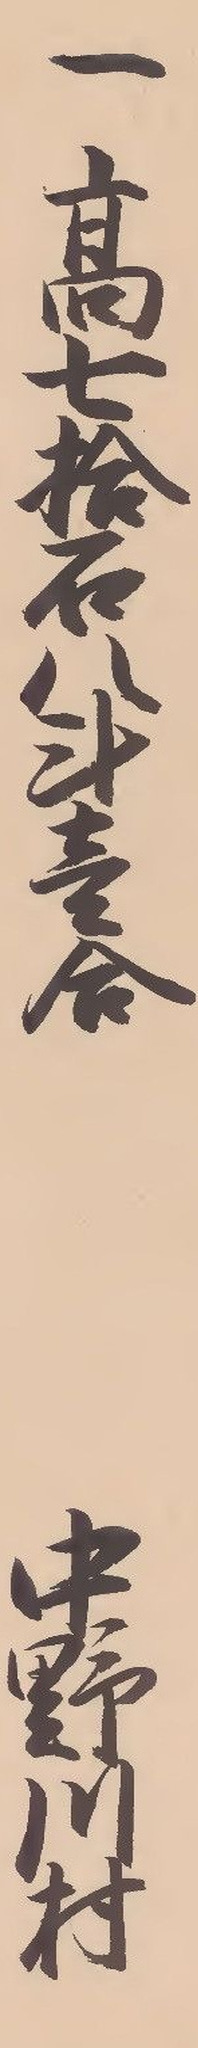一高七拾石八斗壱合中野川村
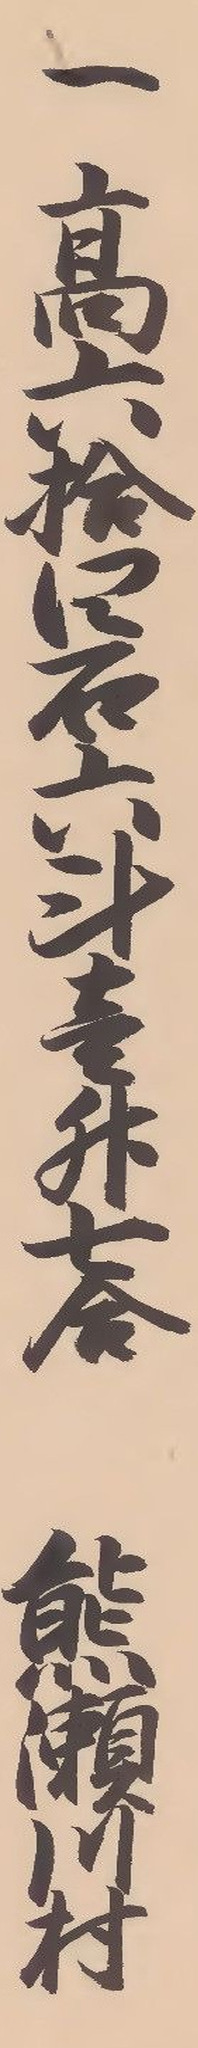一高六拾四石六斗壱升七合熊瀬川村
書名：紀伊国郷帳
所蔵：国立公文書館 National Archives of Japan
